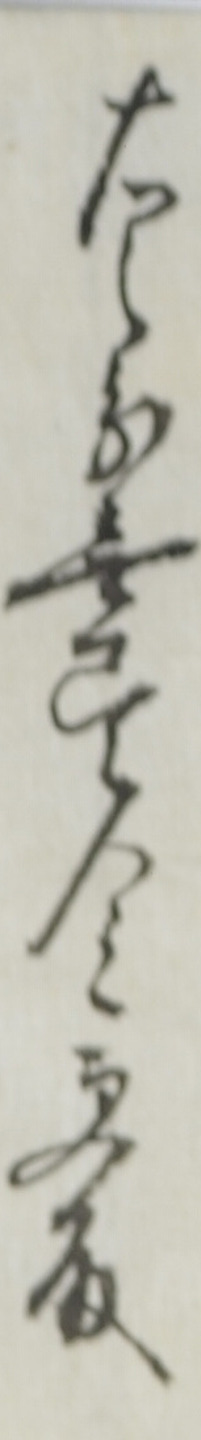右之分無尽金受取
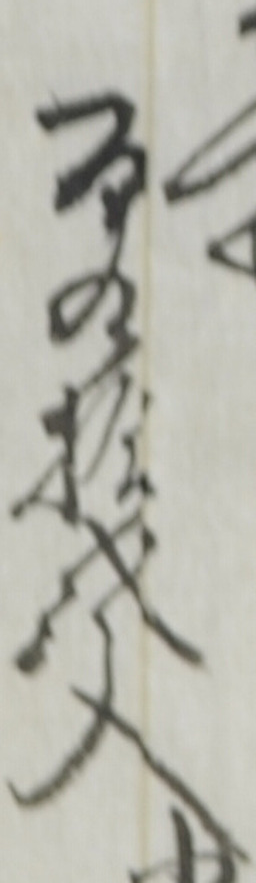百九拾弐文
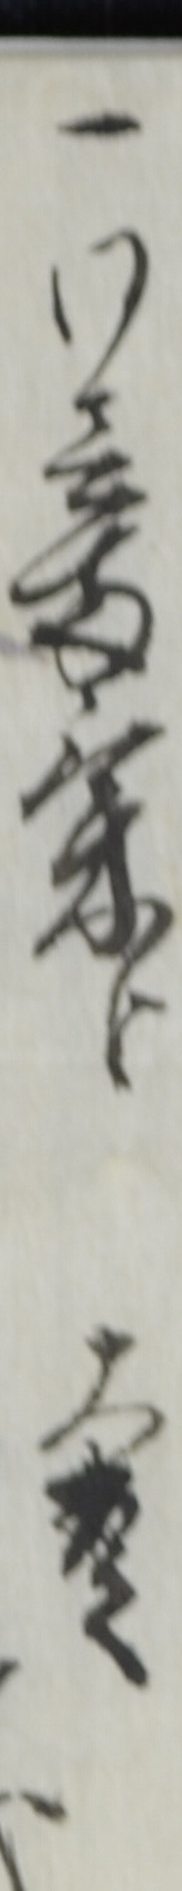一同壱両三朱ト大麦
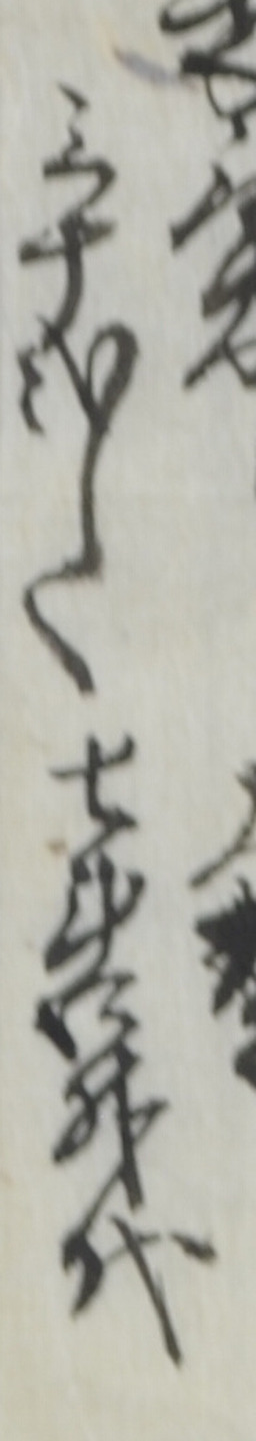三十弐文七斗四升代
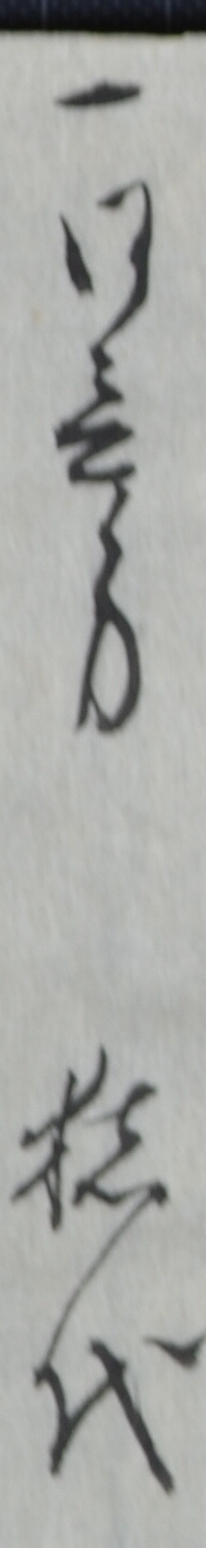一同壱分猪代
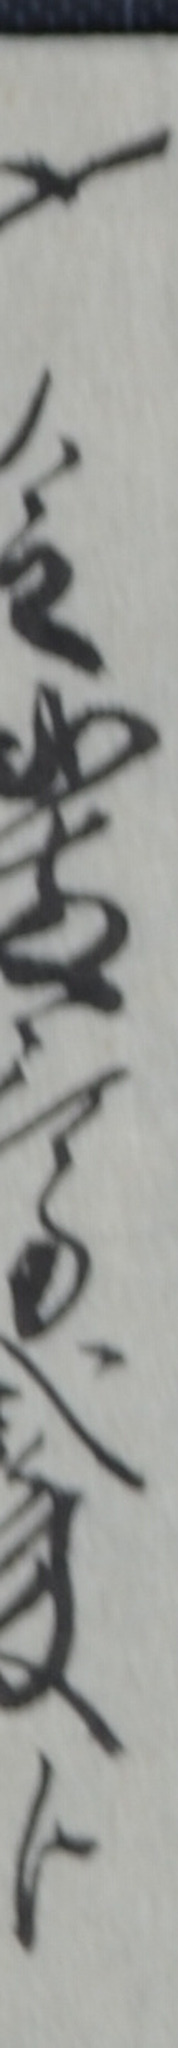〆金弐両三分弐朱ト

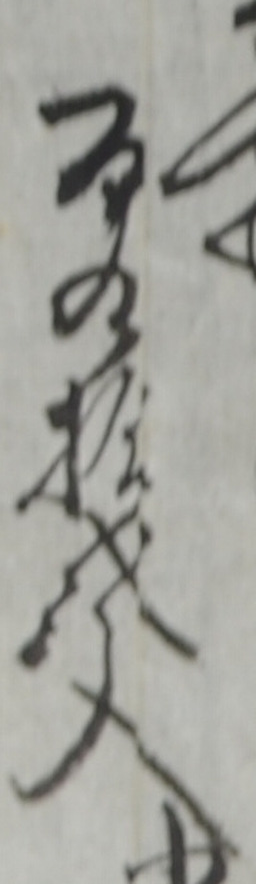百九拾弐文
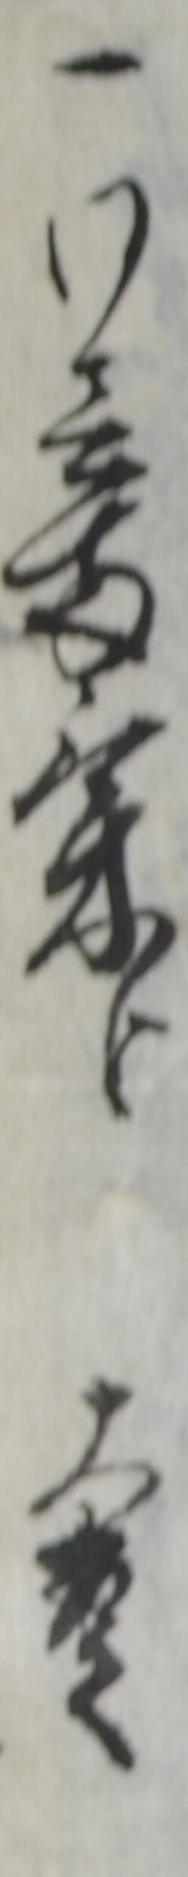一同壱両三朱ト大麦
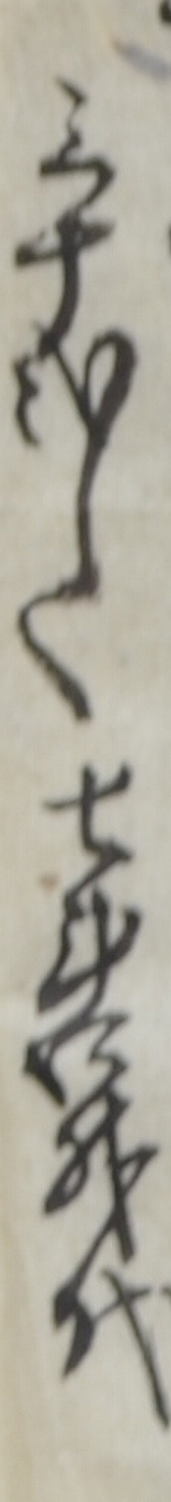三十弐文七斗四升代
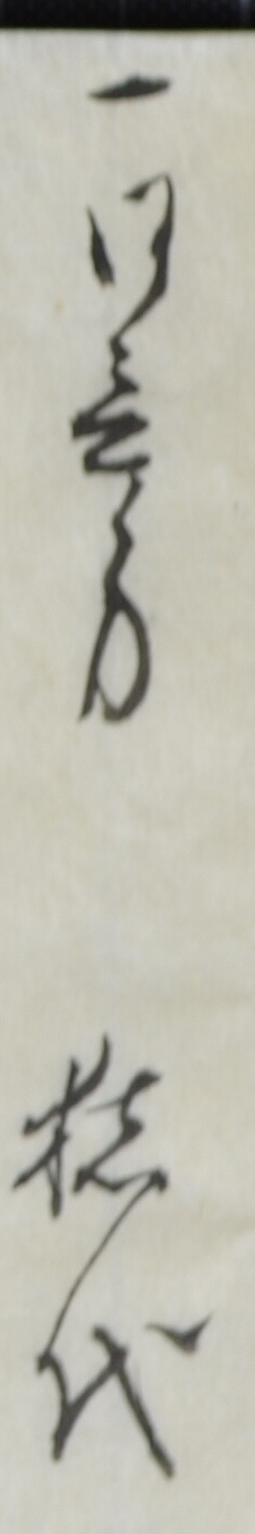一同壱分猪代
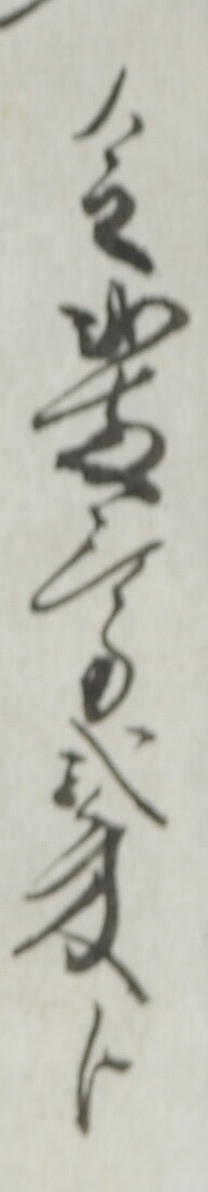〆金弐両三分弐朱ト
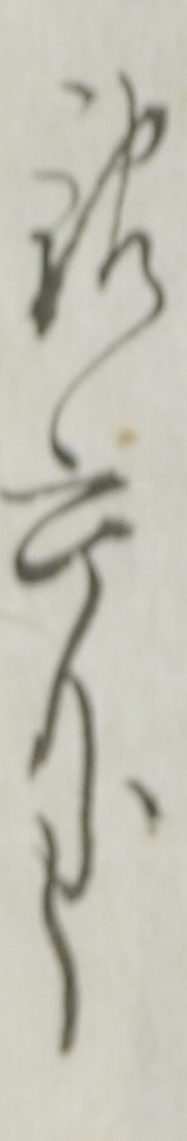銀六匁
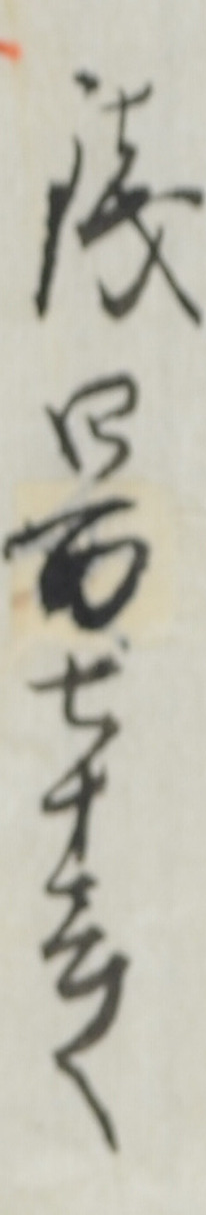銭四百七十壱文
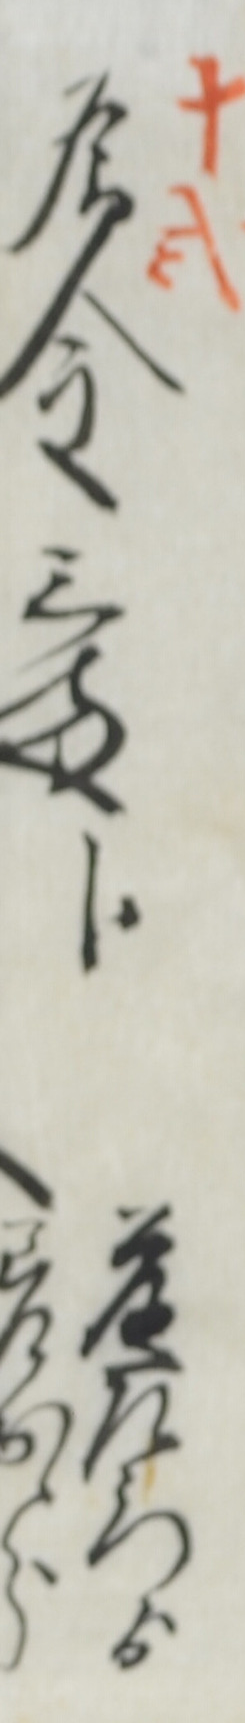為金三両ト藤左衛門ゟ
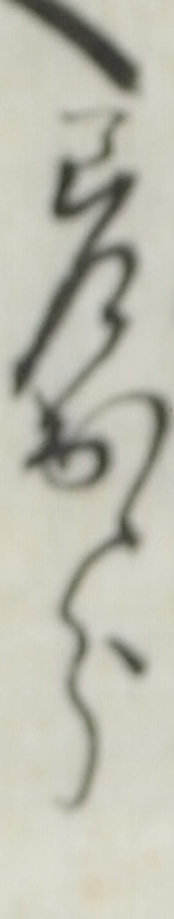差出候分
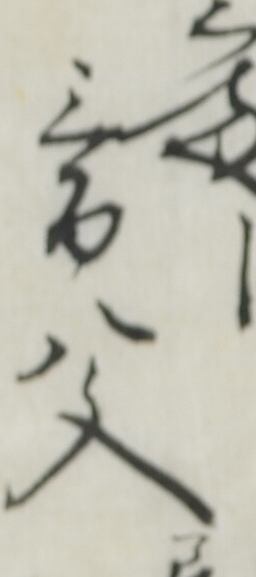三百八文
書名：（金銭勘定抜書）
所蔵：伊那市立高遠町図書館・合同会社AMANE
